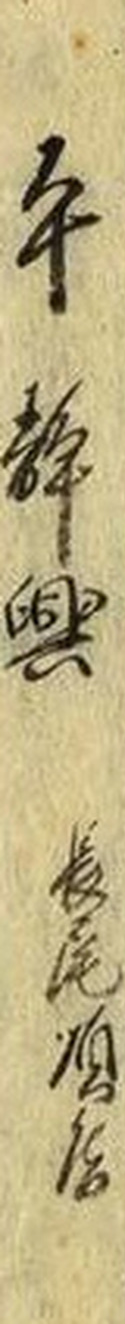平静興長尾順房
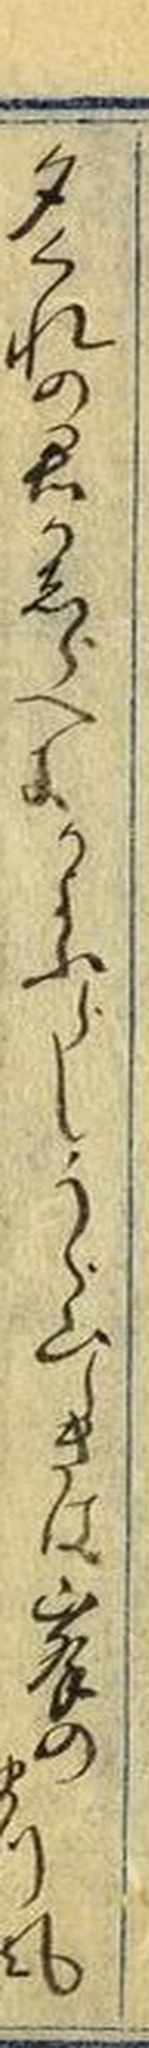夕くれの君かしらへにかよふらしうら山しきは峯のまつ風
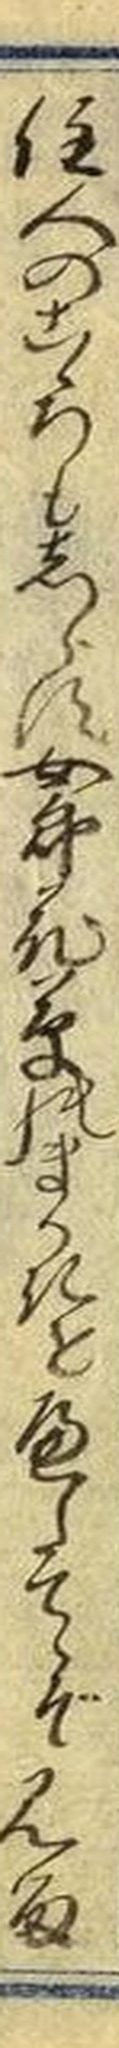住人のこゝろもしらす女郎花草のまかきをへたてゝぞみる
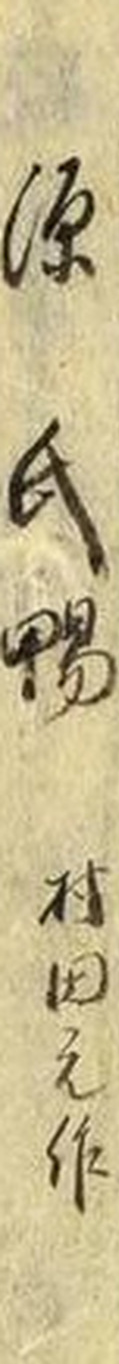源氏暢村田元作
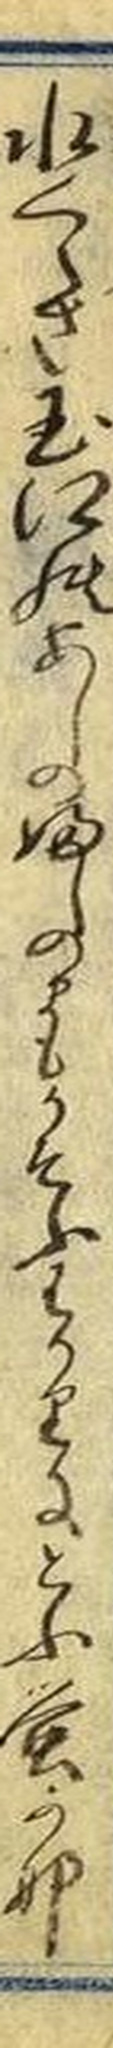水くらさ玉えのあしのふしのまもかそふはかりにとふ蛍かな

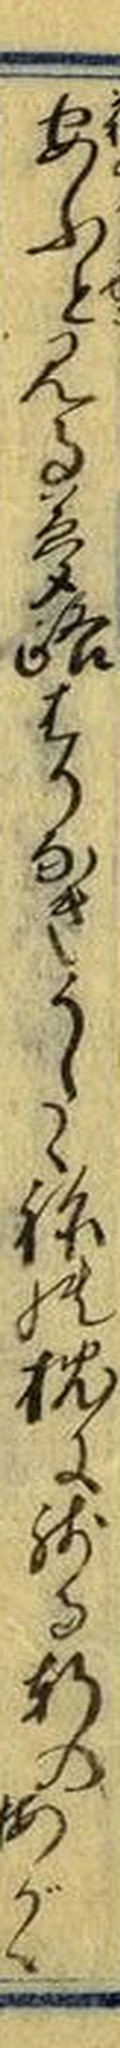あふと見る夢路はかなきうたゝねの枕に残る軒の梅がへ
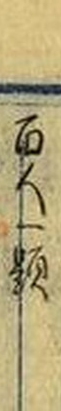百人一題
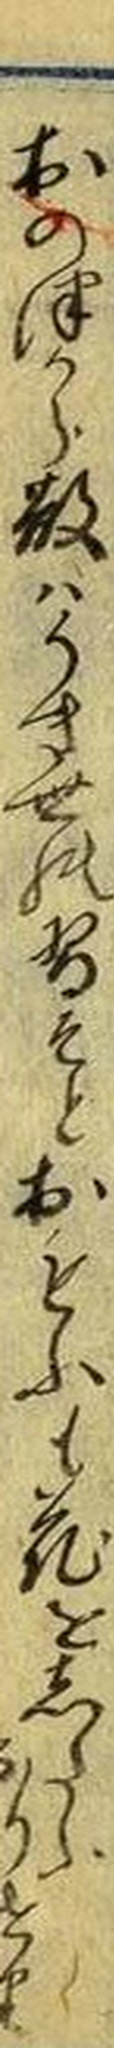おのつから散はうき世の雪そとおもふ花をしたふなりけり
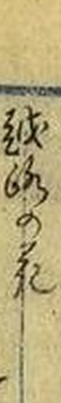越路の花
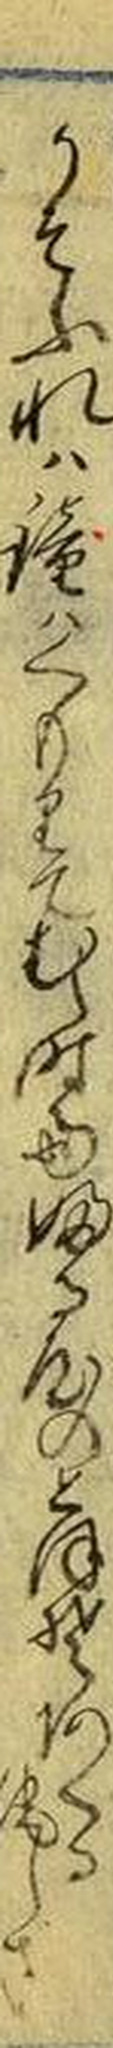かそふれは鐘はくもりてむら時雨ふるやのとほせあくる侘しさ
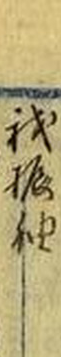我振袖
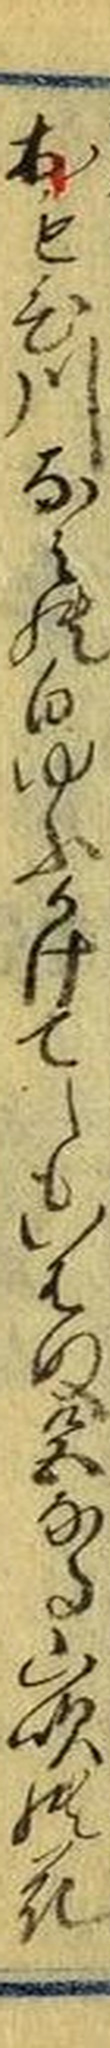おもひ川なみの白ゆふかけてしもいはぬ宮なる山吹の花
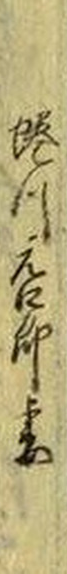岩女蜷川元四郎妻
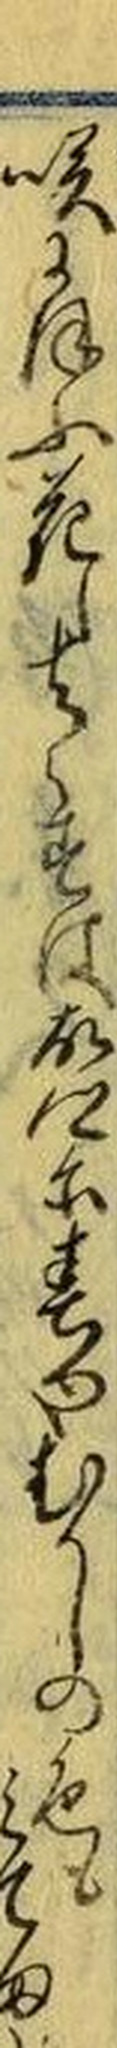咲にほふ花しちらすは故郷に春やむかしの色もみてまし
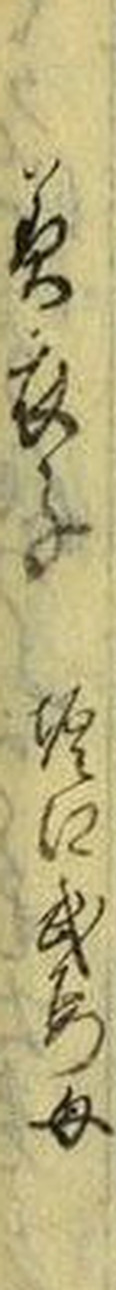美衣子堀江武右衛門妻
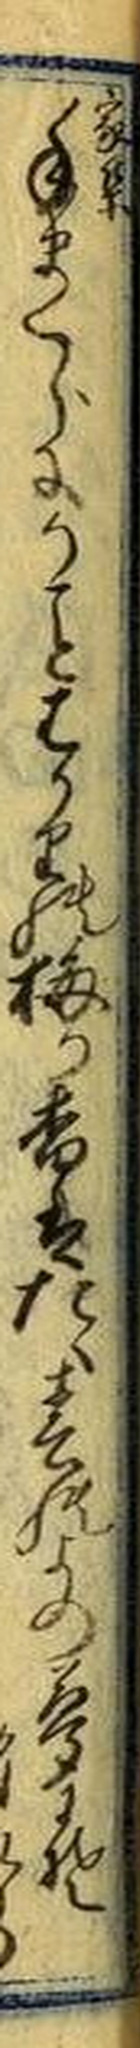手まくらにかことはかりの梅か香はたゝ春のよの夢にそ有ける
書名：温古集 三巻
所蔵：福井県文書館 Fukui Prefectural Archives
